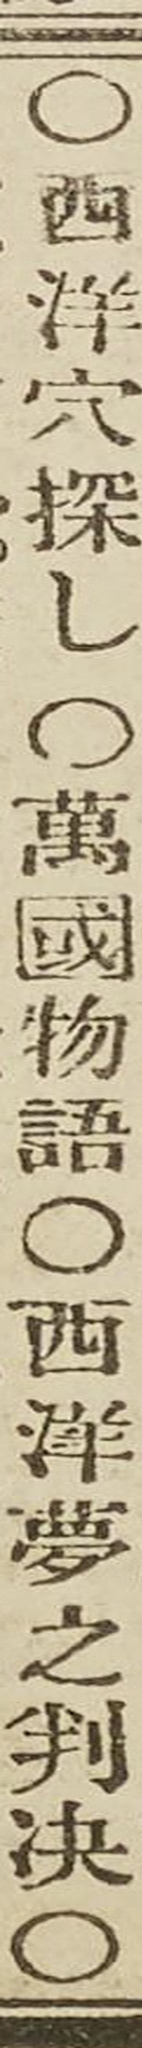○西洋穴探し○万国物語○西洋夢之判決○
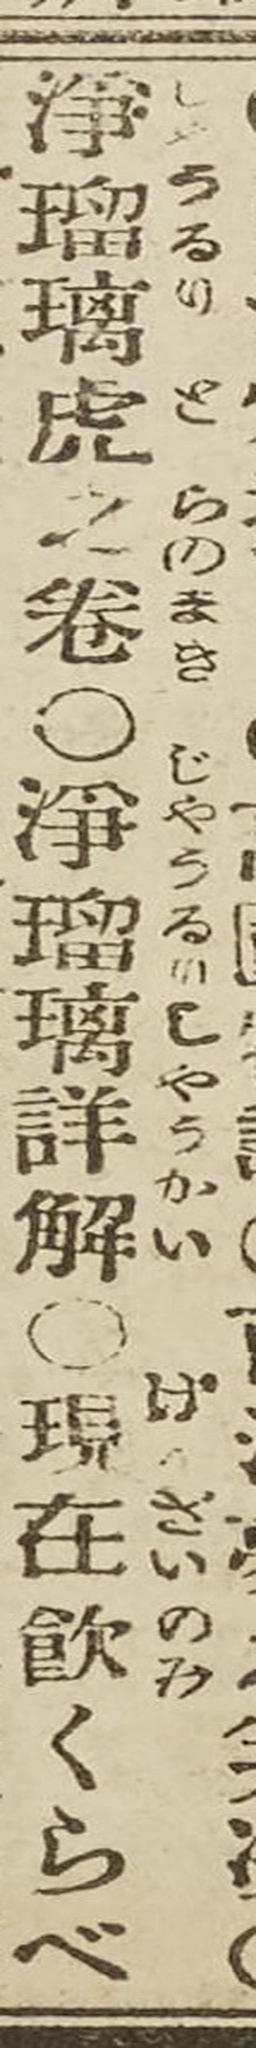浄瑠璃虎之巻○浄瑠璃詳解○現在飲くらべ
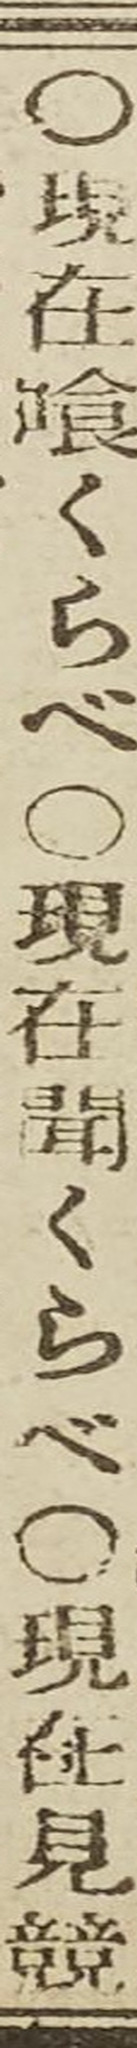○現在喰くらべ○現在聞くらべ○現在見競
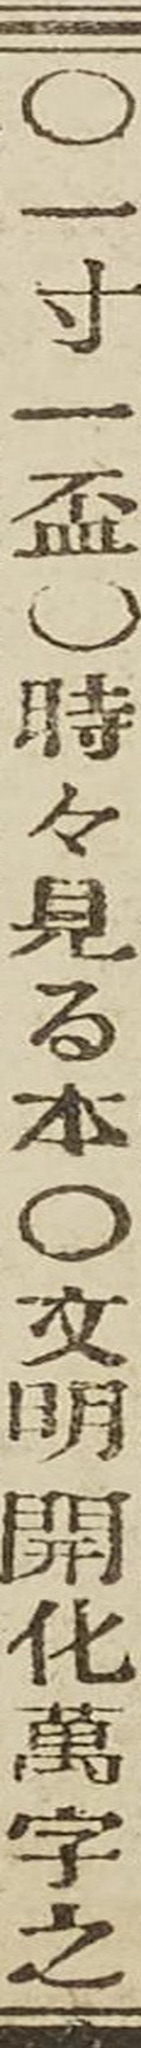○一寸一盃○時々見る本○文明開化万字之
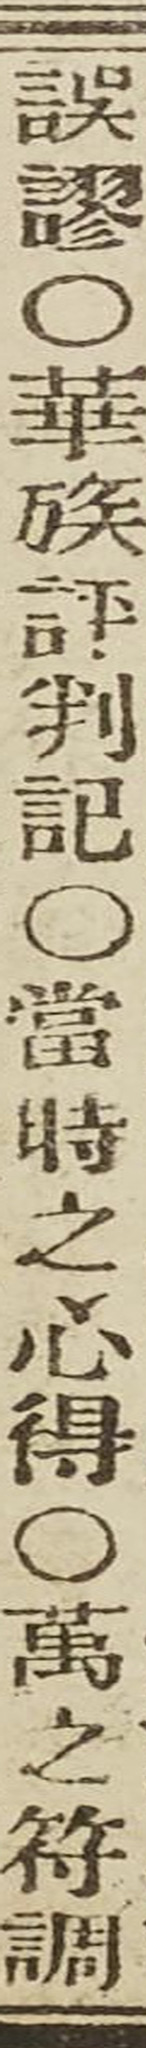誤謬○華族評判記○当時之心得○万之符調
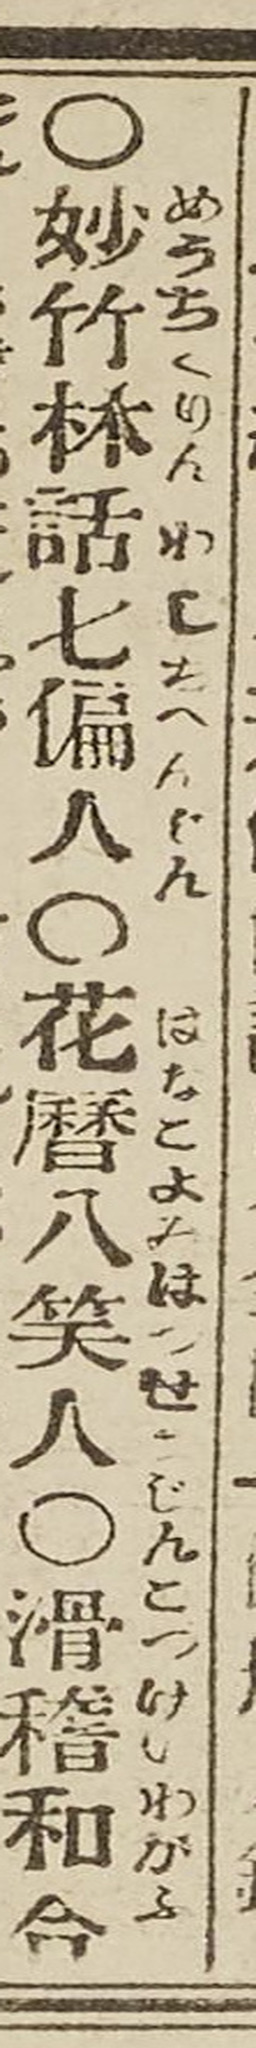○妙竹林話七偏人○花暦八笑人○滑稽和合
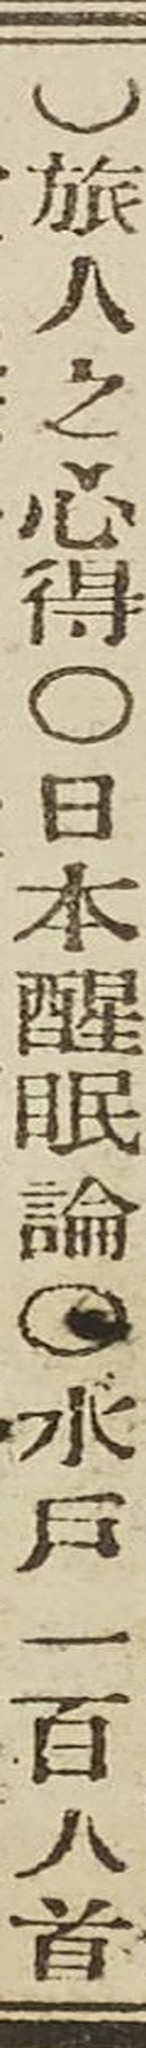○旅人之心得○日本醒眠論○水戸一百人首
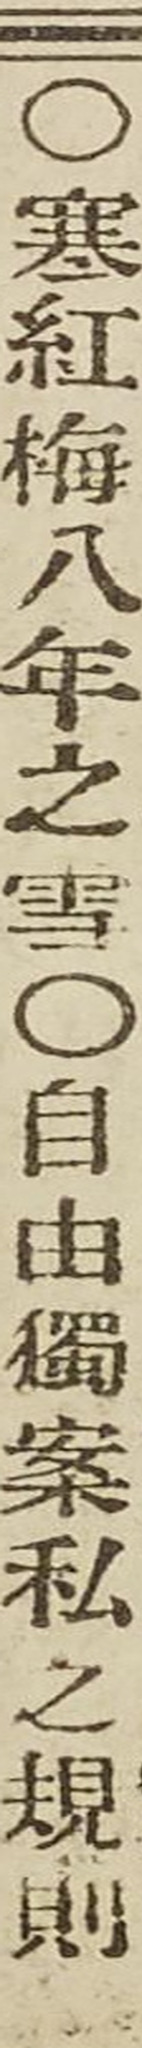○寒紅梅八年之雪○自由獨案私之規則
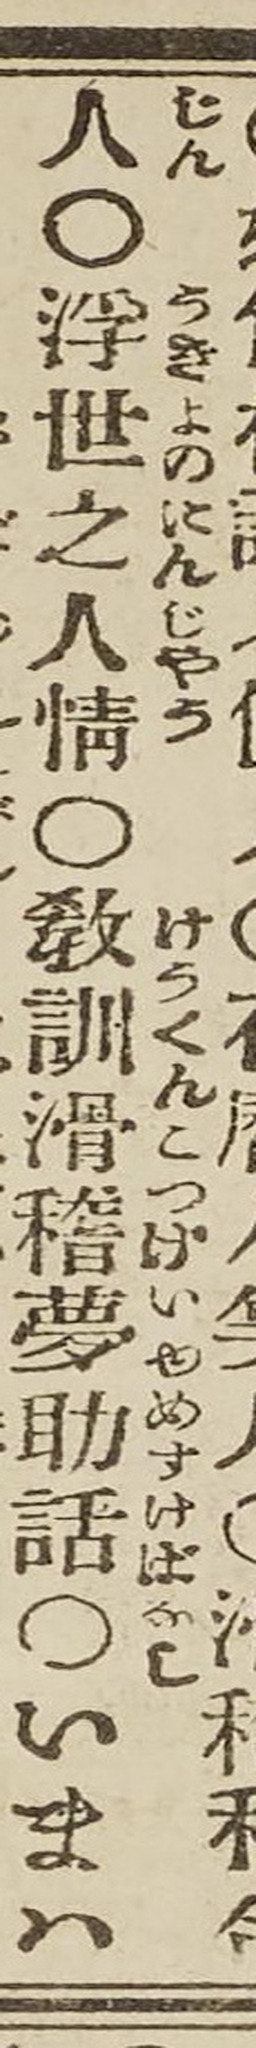人○浮世之人情○教訓滑稽夢助話○いまは
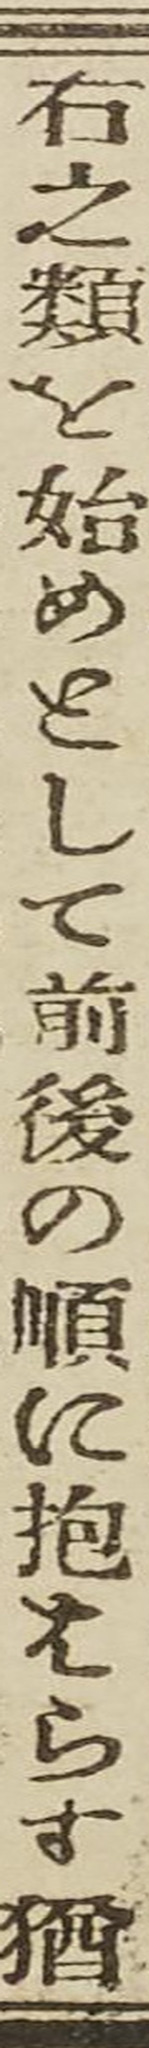右之類を始めとして前後の順に抱はらす猶
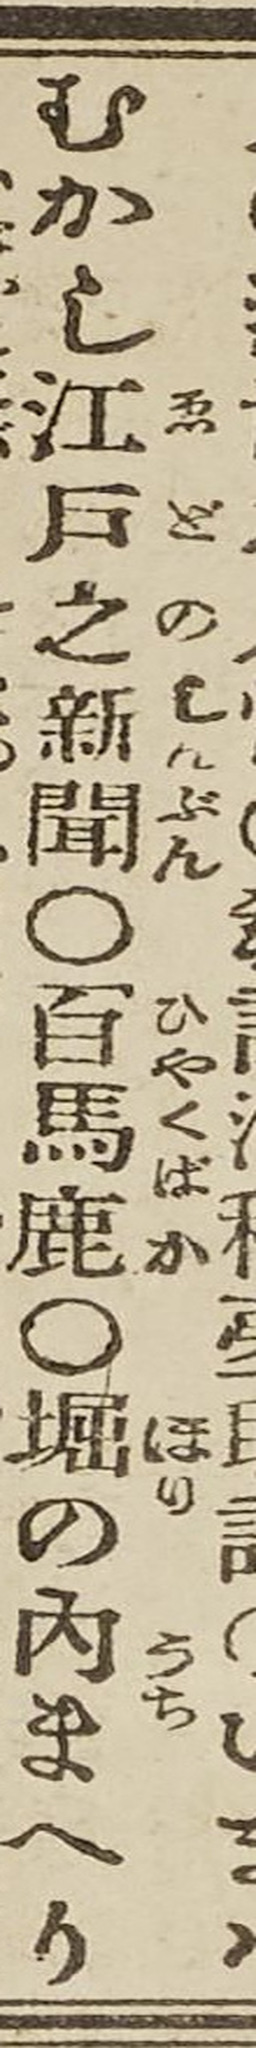むかし江戸之新聞○百馬鹿○堀の内まへり
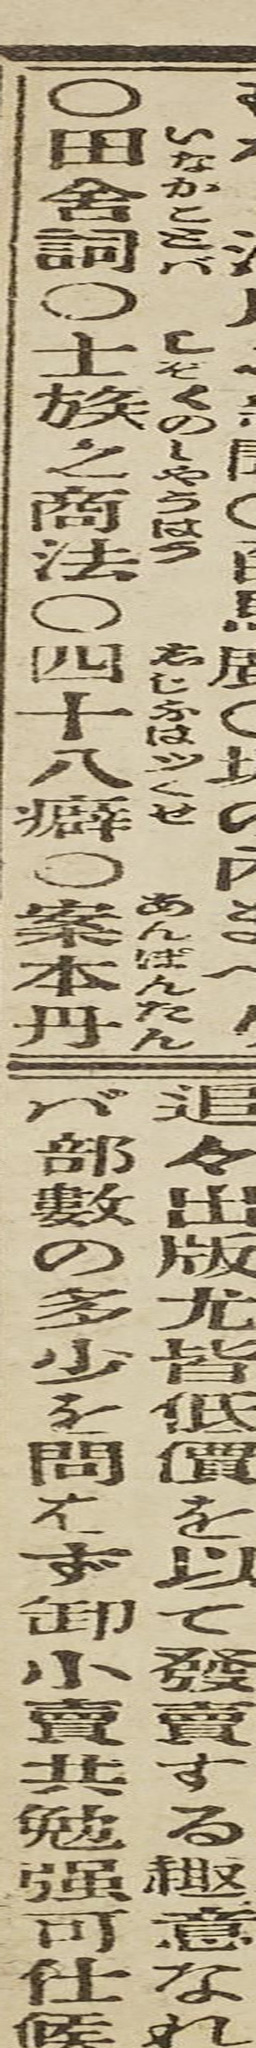○田舎詞○士族之商法○四十八癖○案本丹
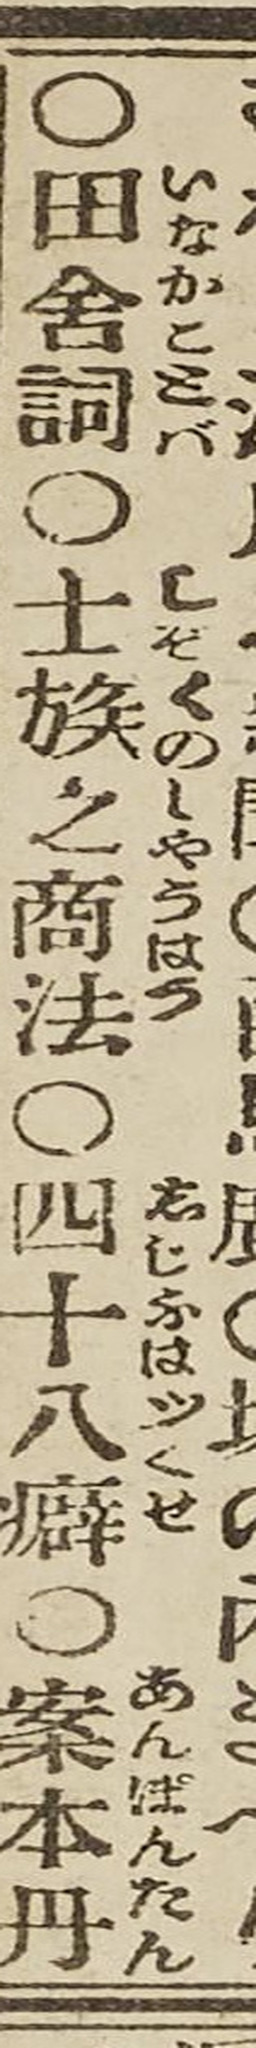○田舎詞○士族之商法○四十八癖○案本丹
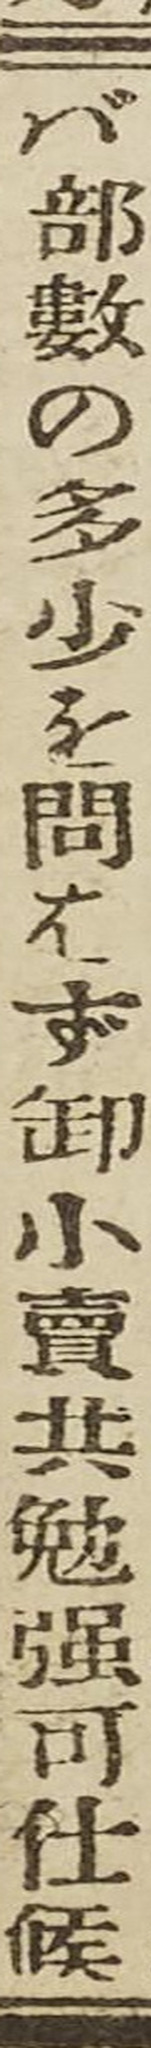ば部数の多少を問はず卸小売共勉強可仕候
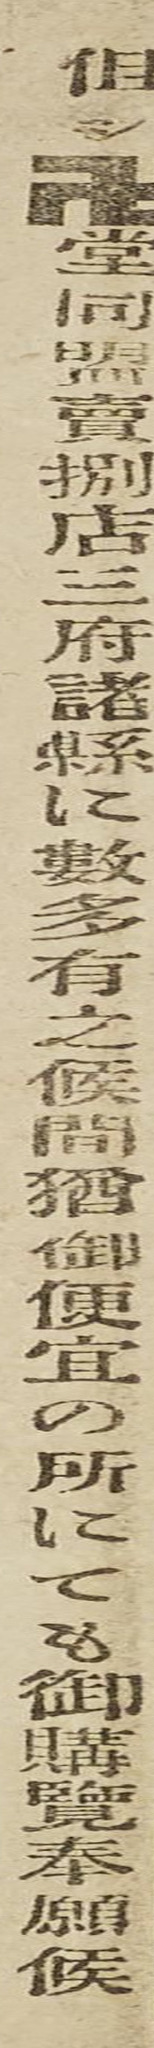但シ卍堂同盟売捌店三府諸県に数多有之候間猶御便宜の所にても御購覧奉願候
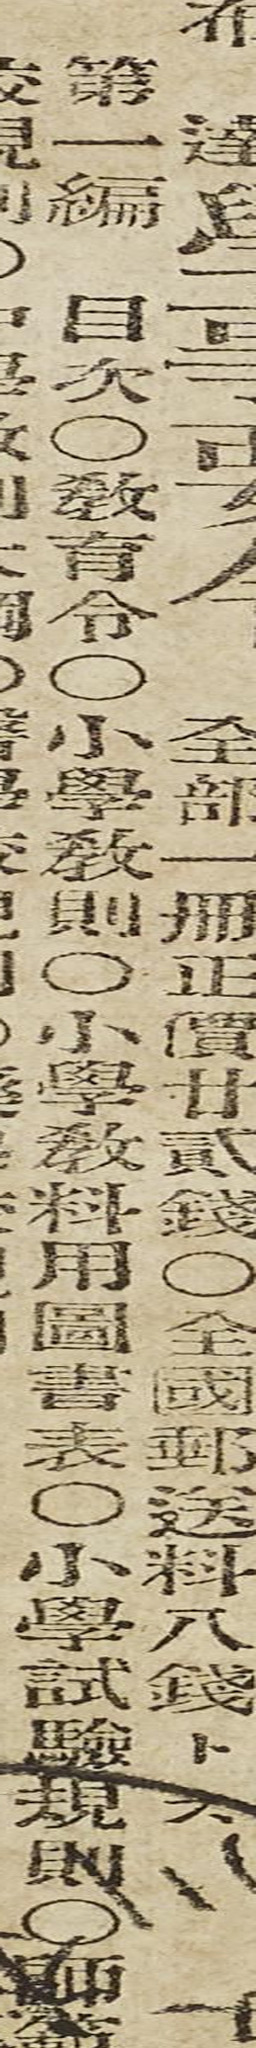第一編目次○教育令○小学教則○小学教料用図書表○小学試験規則○師範学
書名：永代惨話　文化の夢　全
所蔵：東京大学地震研究所図書室 Earthquake Research Institute Library, The University of Tokyo, JAPAN
